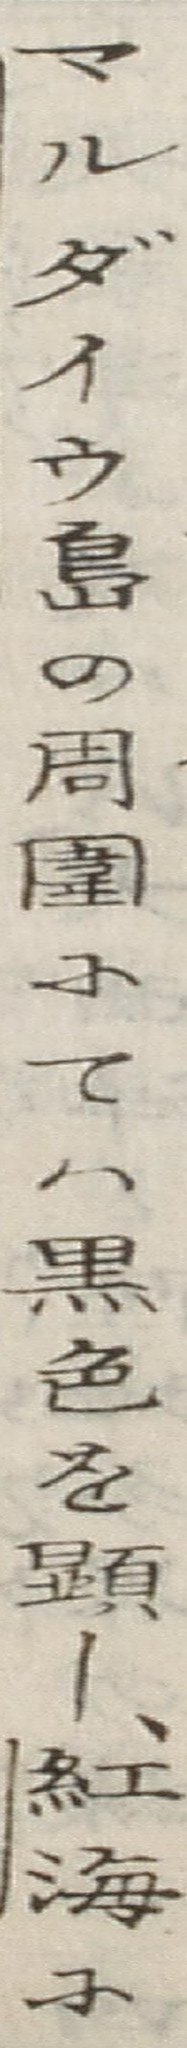マルダイウ島の周囲にては黒色を顕し、紅海に
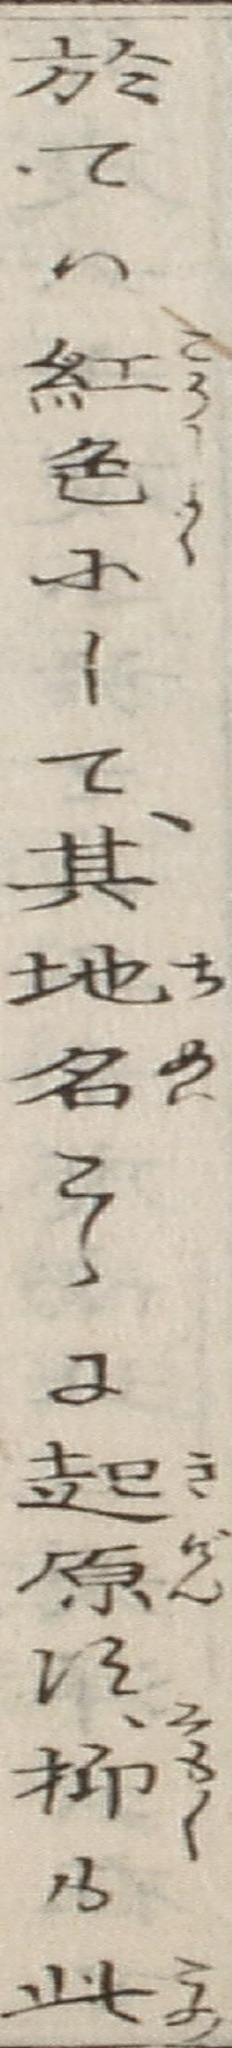於ては紅色にして、其地名こゝに起原す、抑々此
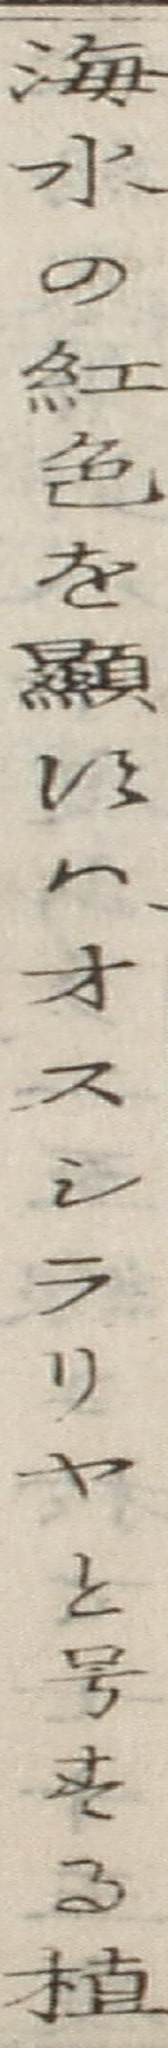海水の紅色を顕すは、オスシラリヤと号する植
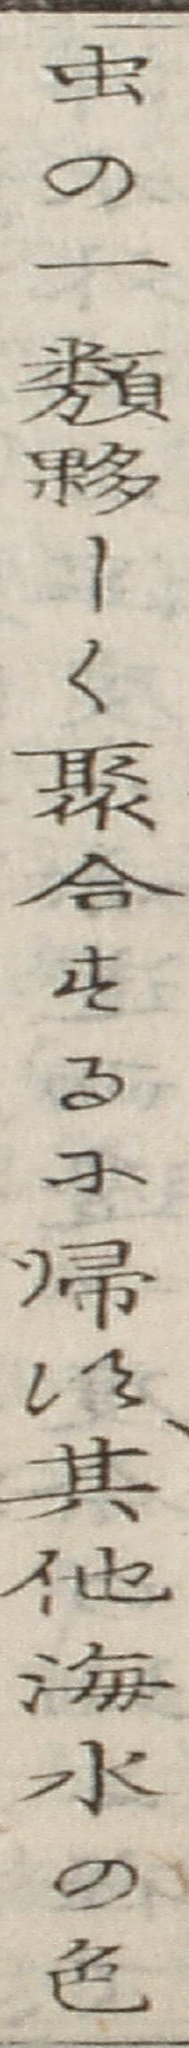虫の一類夥しく聚合するに帰す、其他海水の色
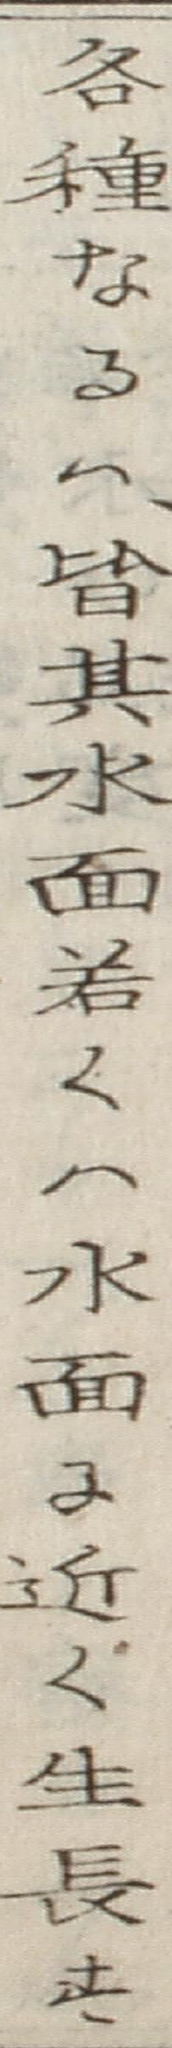各種なるは、皆其水面若くは水面に近く生長す
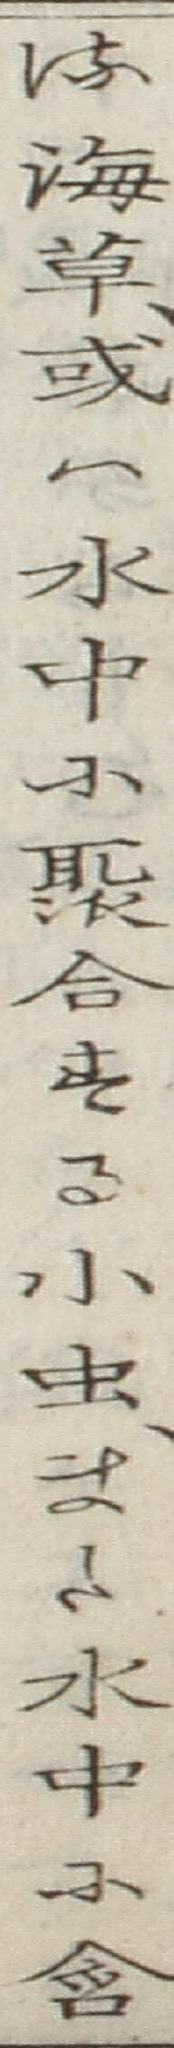る海草、或は水中に聚合する小虫、また水中に含
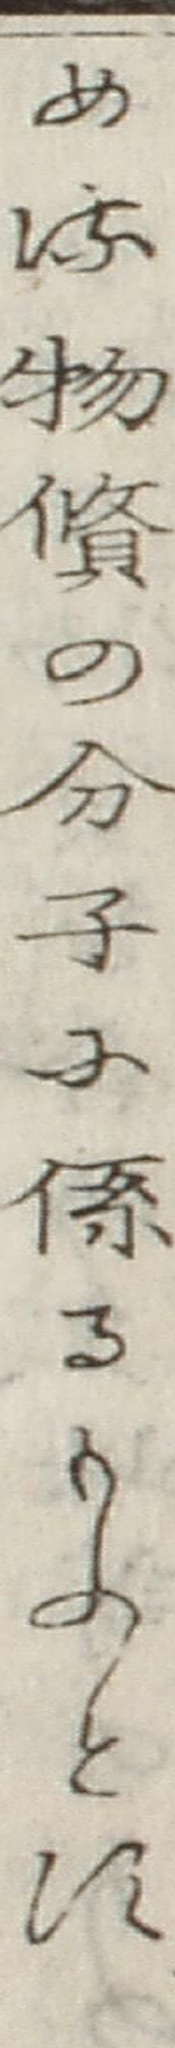める物質の分子に径るものとす、
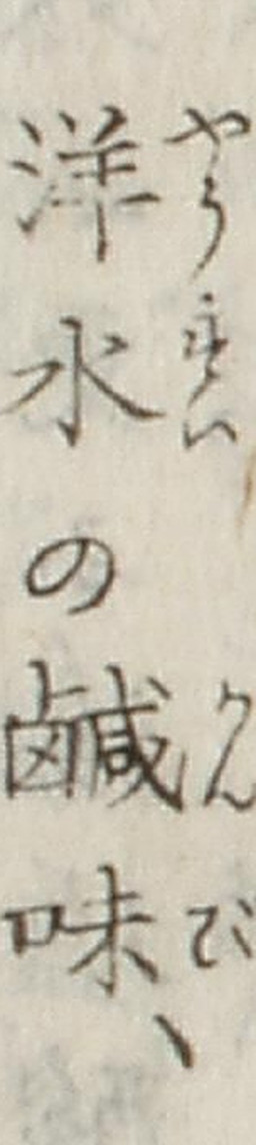洋水の鹹味、
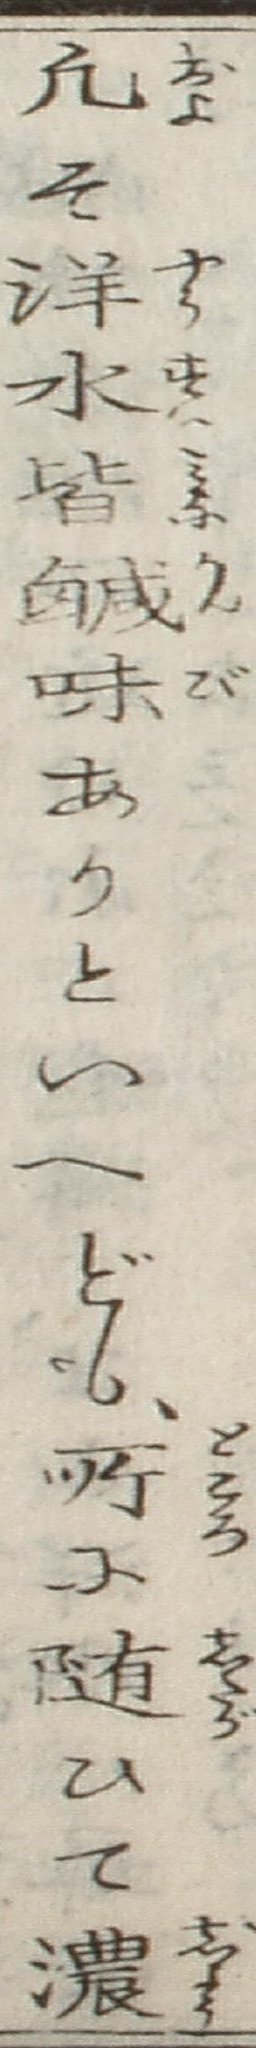凡そ洋水皆鹹味ありといへども、所に随ひて濃
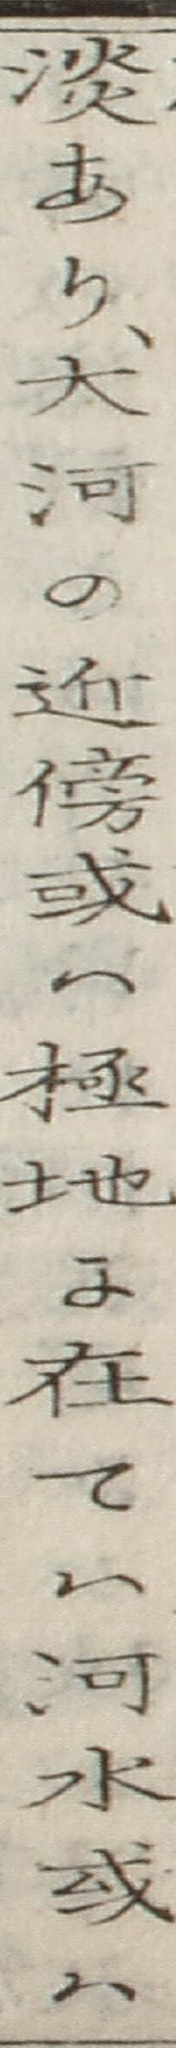淡あり、大河の近傍或は極地に在ては、河水或は

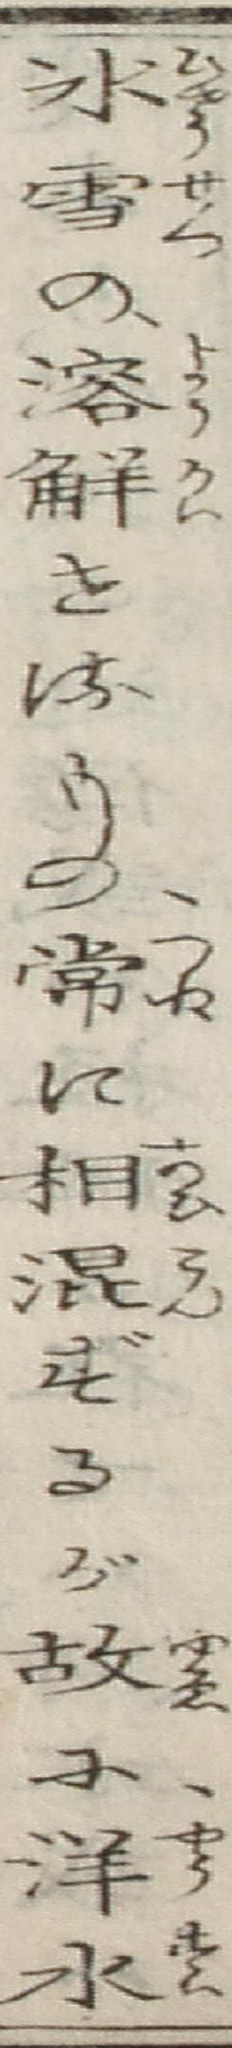氷雪の溶解せるもの、常に相混ずるが故に、洋水
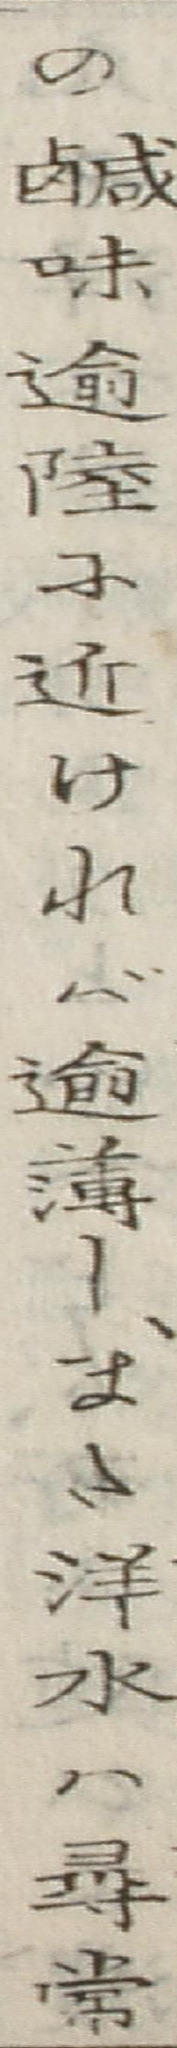の鹹味愈陸に近ければ愈薄し、また洋水は尋常
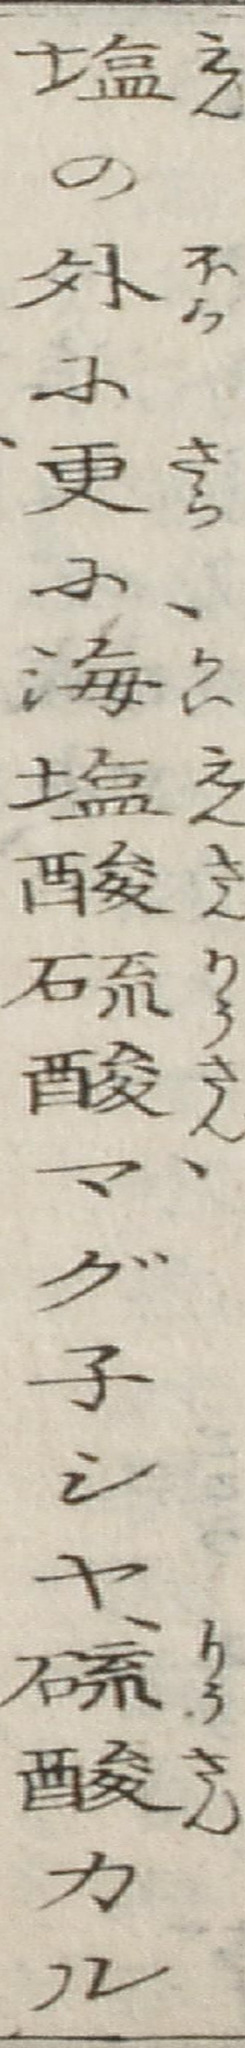塩の外に更に、海塩酸硫酸、マグ子シヤ、硫酸カル
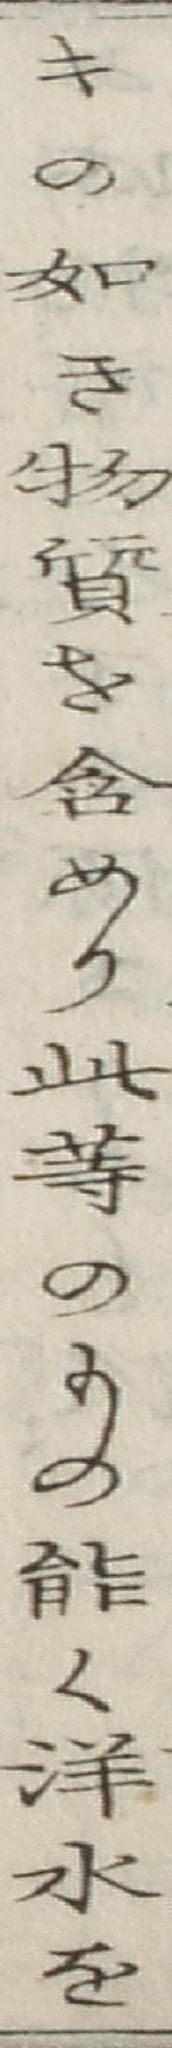キの如き物質を含めり、此等のもの能く洋水を
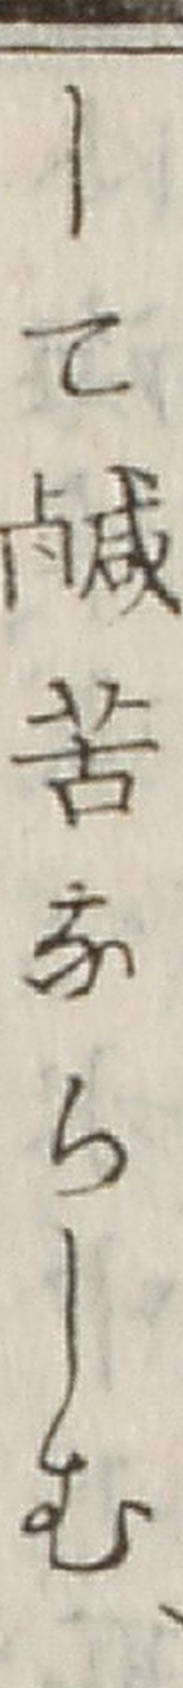して鹹苦ならしむ、
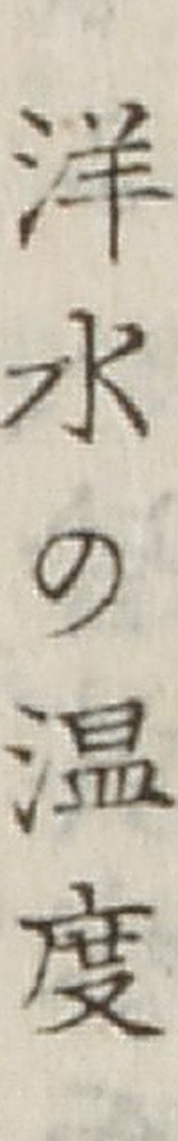洋水の温度
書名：訓蒙　天然地理學　中
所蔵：東京大学地震研究所図書室 Earthquake Research Institute Library, The University of Tokyo, JAPAN
